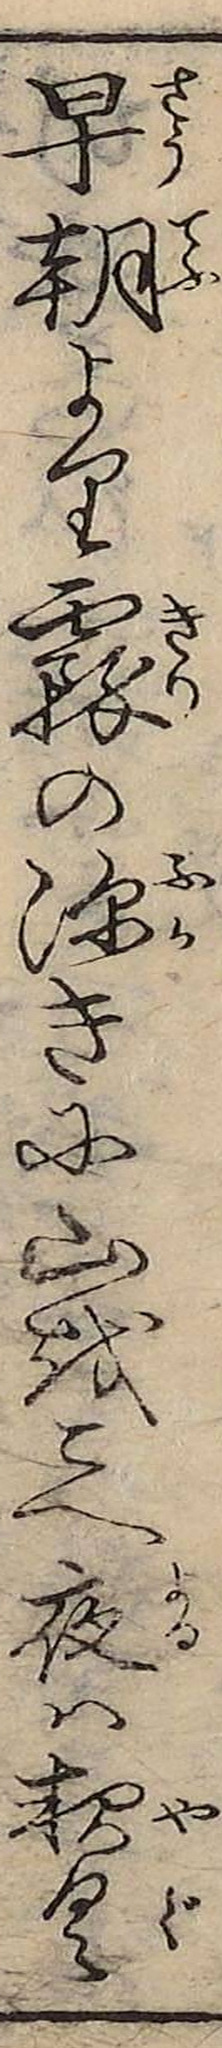早朝より霧の深きに山をこへ夜は夜具
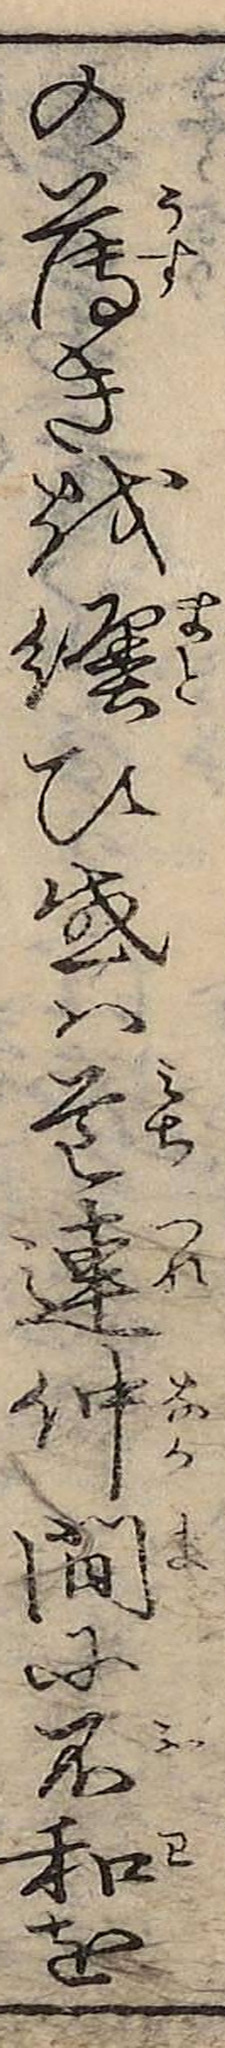の薄きを纏ひ或は道連仲間に不和を
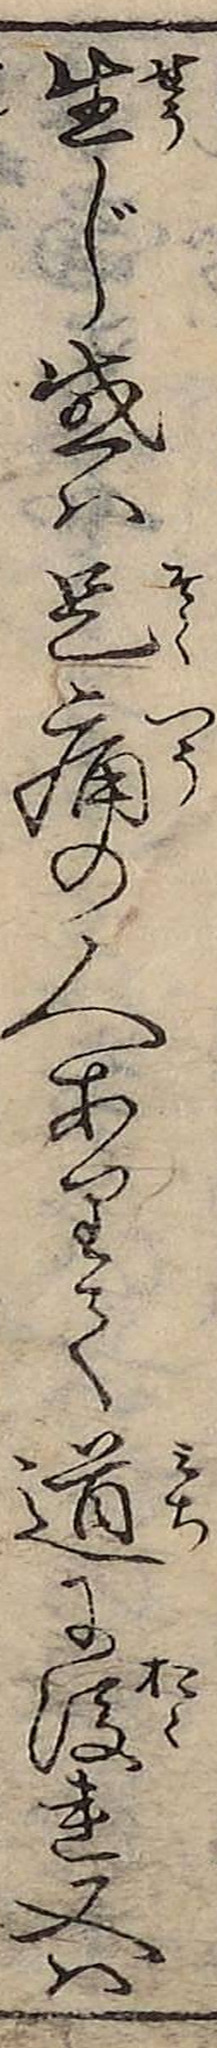生じ或は足痛の人ありて道に後れ又は
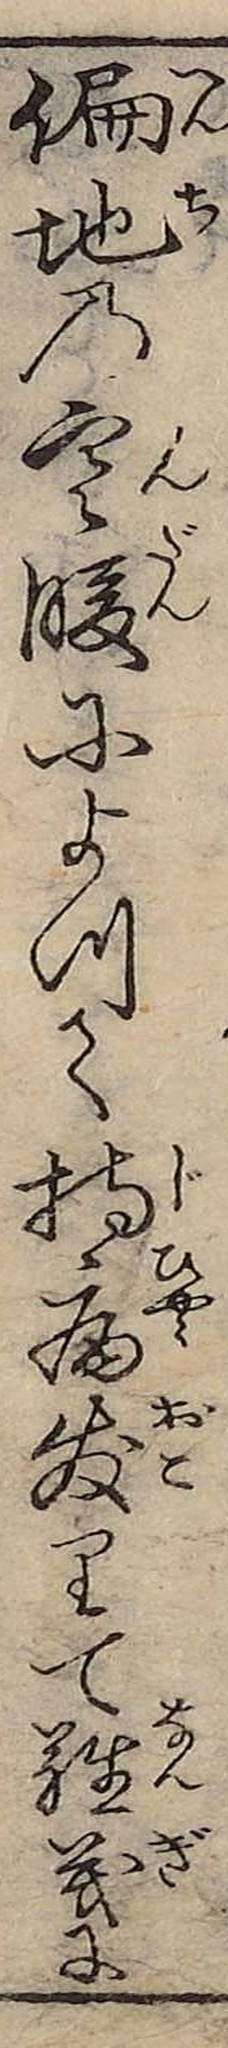偏地の寒暖によつて持病起りて難義に

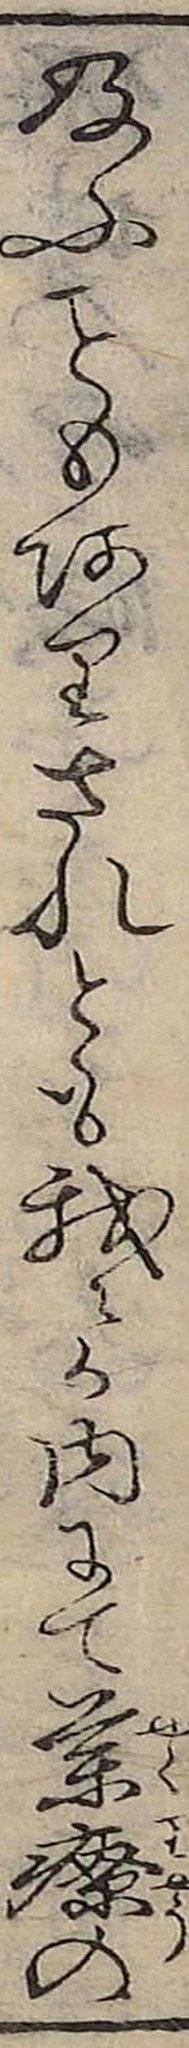及ふこともありされとも我々か内にて薬療の
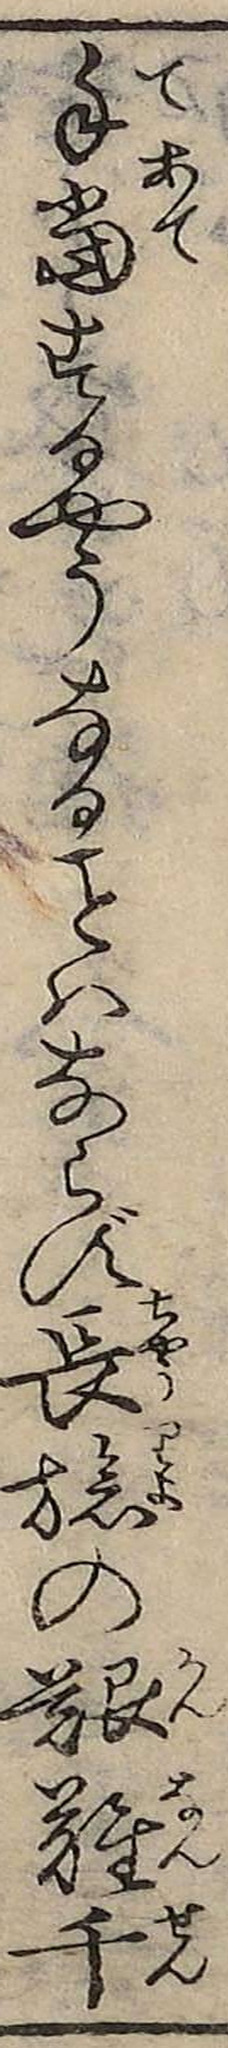手当するやうなることはならず長旅の艱難千
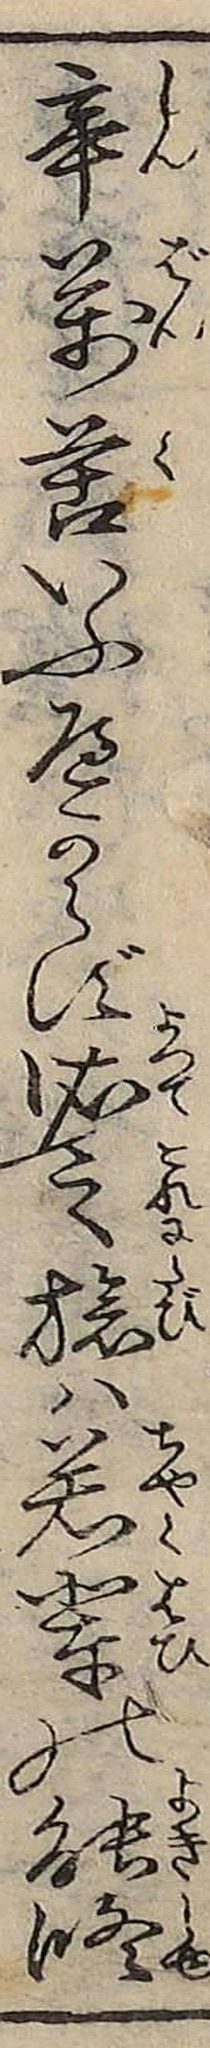辛万苦いふへからず依之旅は若輩の能修
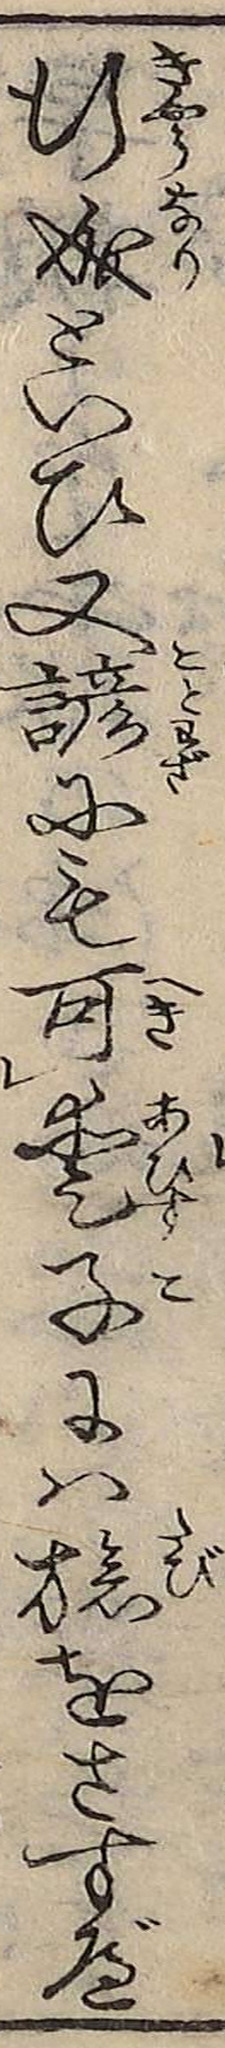行成といひ又諺にも可愛子には旅をさすべ
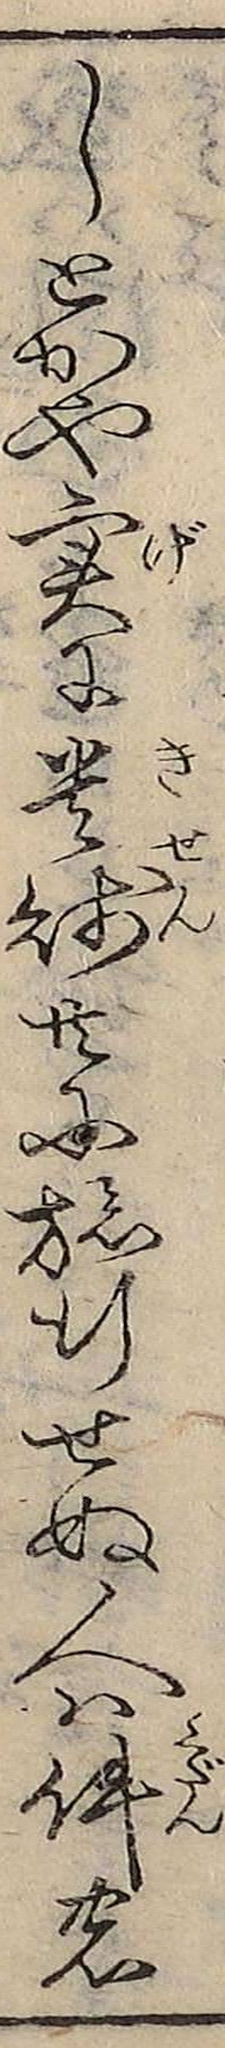しとかや実に貴賤共に旅行せぬ人は件の
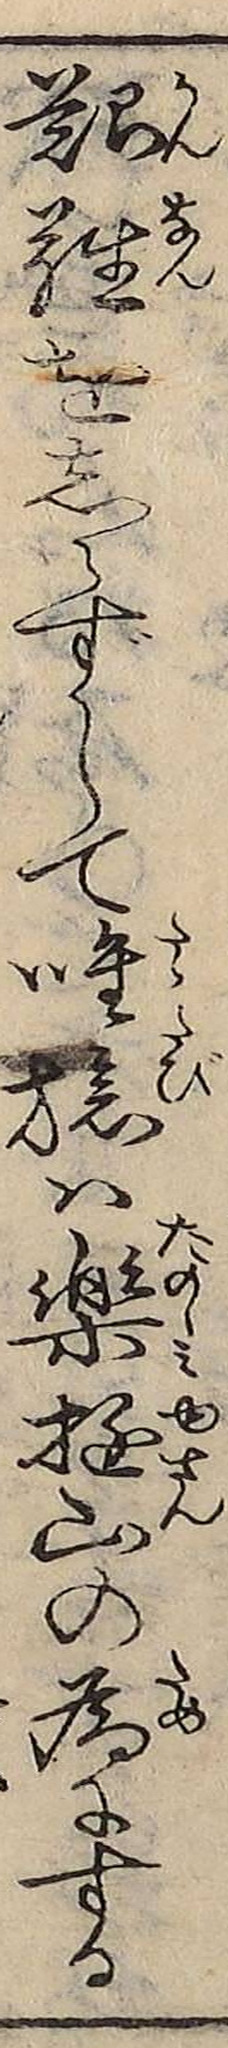艱難をしらずして唯旅は楽遊山の為にする
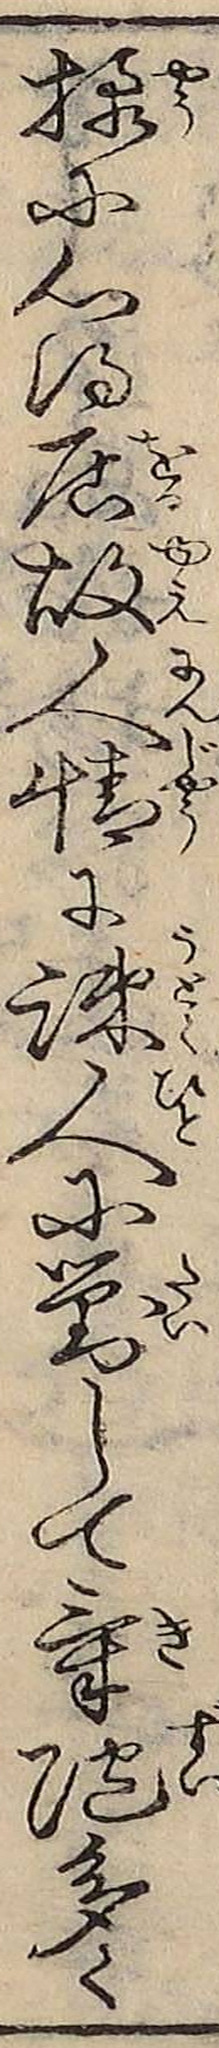様に心得居故人情に疎人に対して気随多く
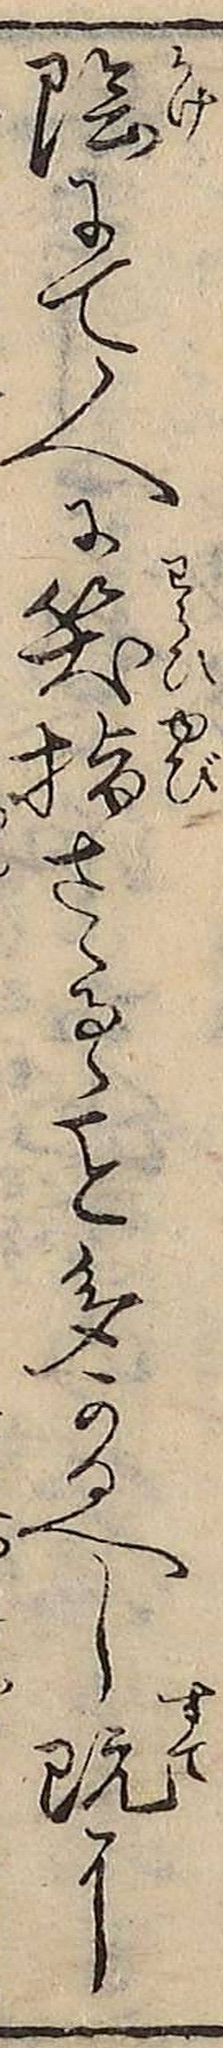陰にて人に笑指さゝるゝこと多かるへし既に
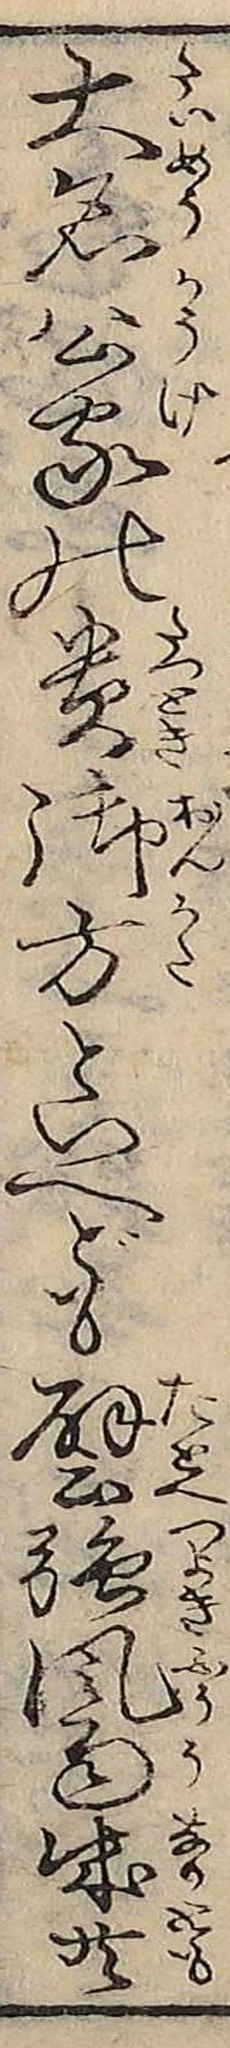大名公家の貴御方といへども譬強風雨成共
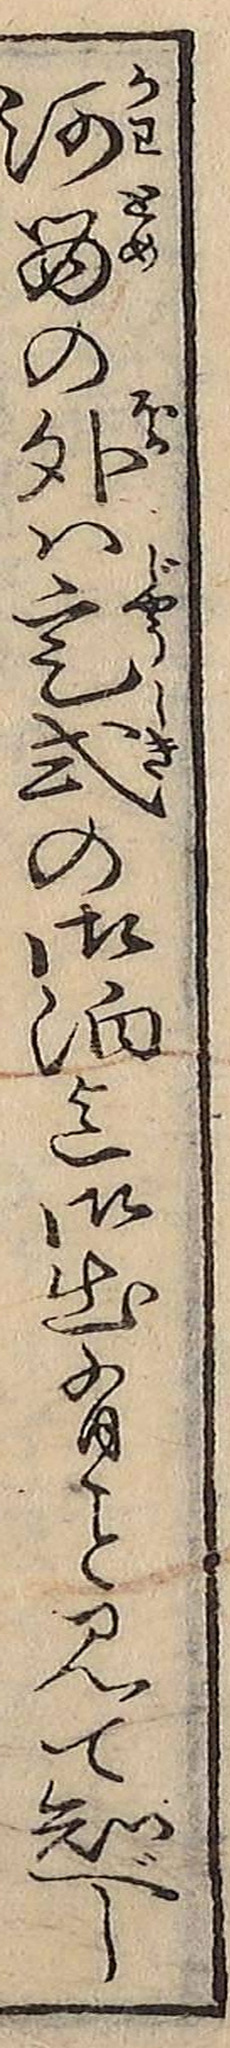河留の外は定式の御泊迄御出有こと見て知べし
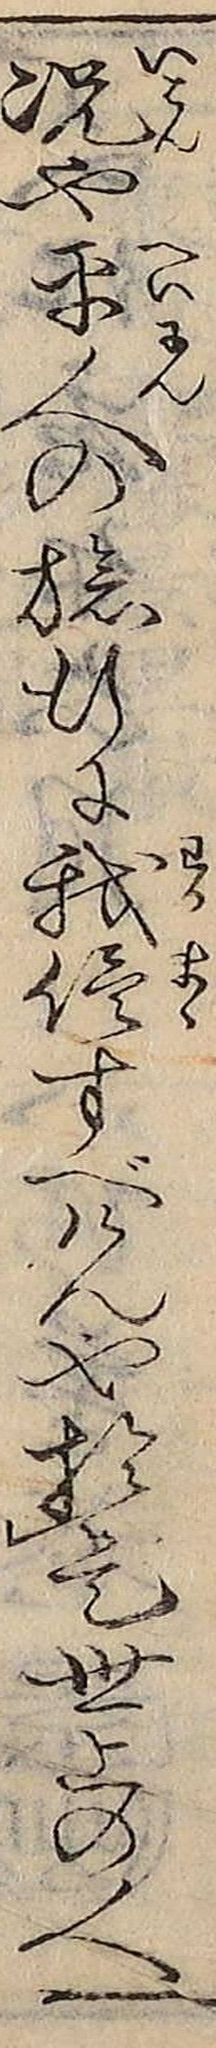況や平人の旅行に我侭すべけんや於是世上の人
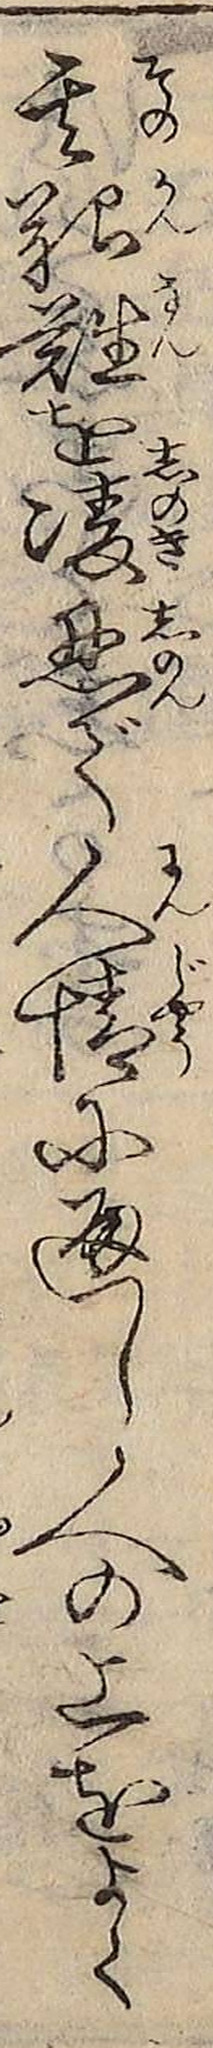其艱難を凌忍で人情に通し人の上をよく
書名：旅行用心集
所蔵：神戸大学附属図書館 国文学研究資料館
